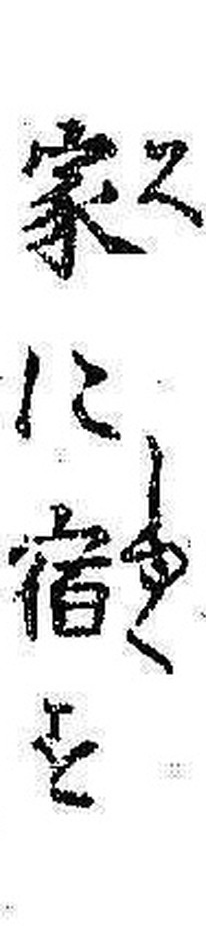家に宿す

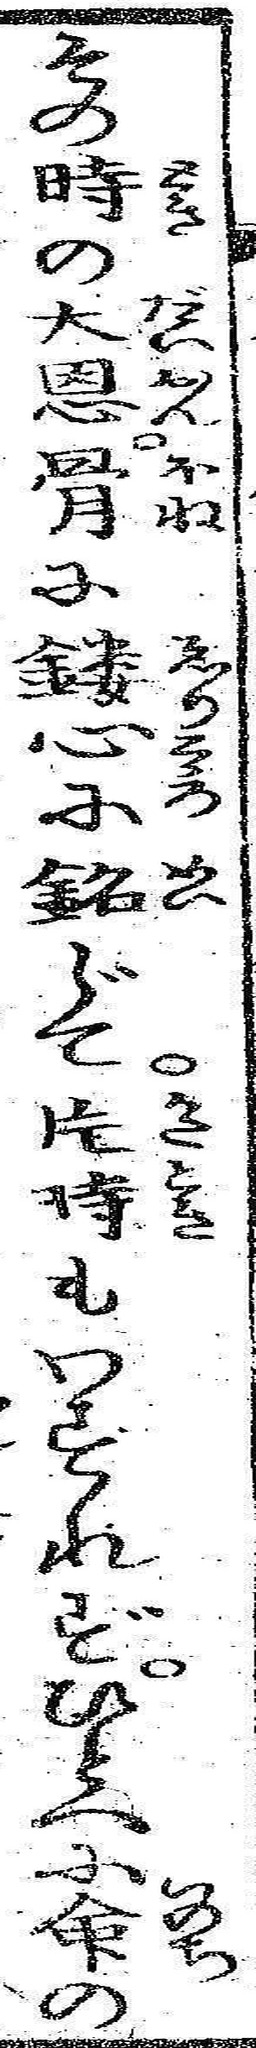その時の大恩。骨に鏤心に銘じて。片時もわすれず。ひとへに命の
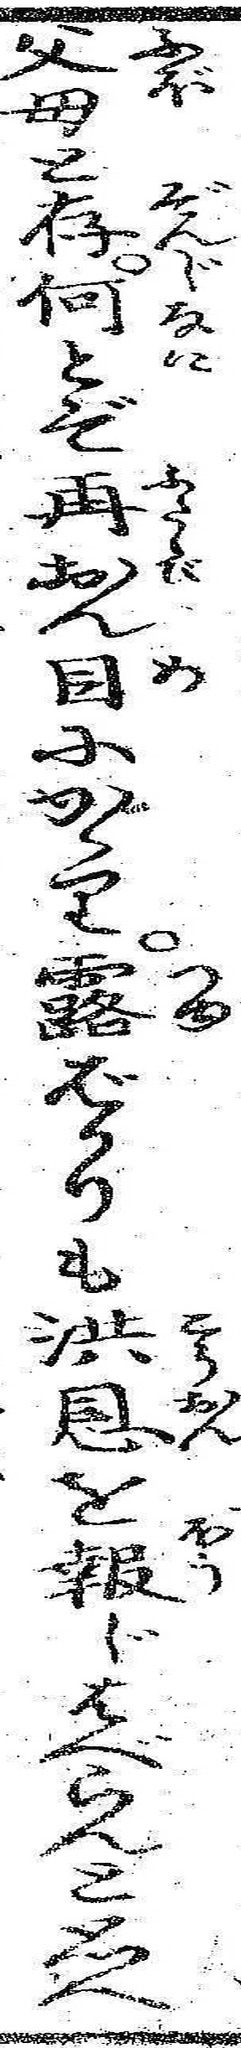父母と存。何とぞ再おん目にかゝり。露ばかりも洪恩を報じはべらんと思へ
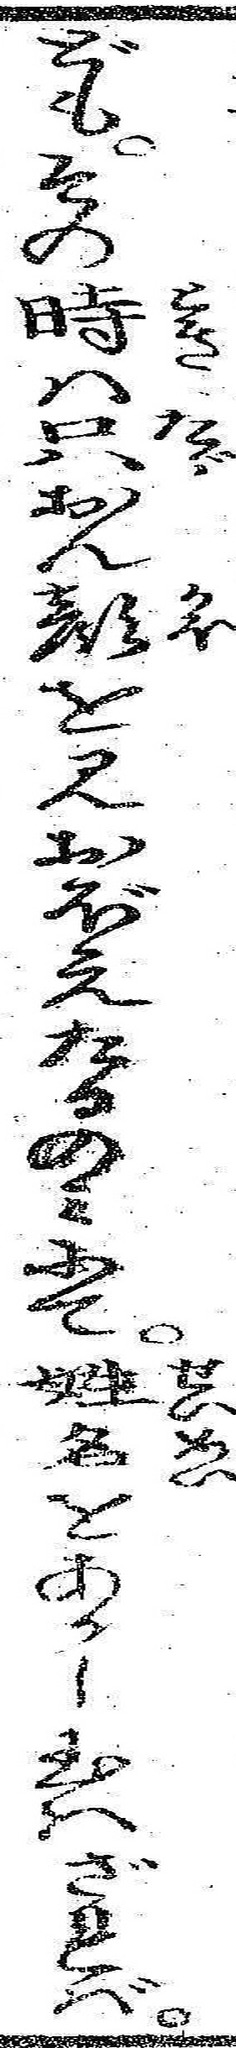ども。その時は只おん顔を見おぼえたるのみにて。姓名をあかし玉はざれば。
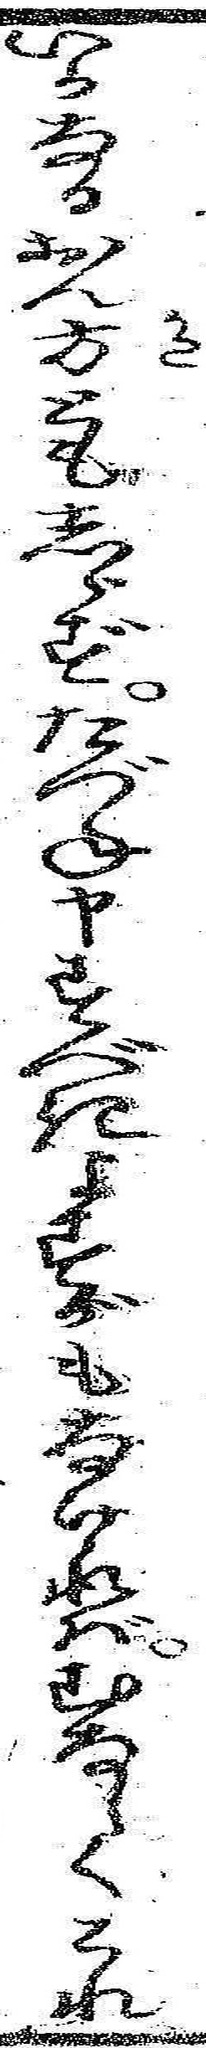いかなるおん方ともしらず。たづね申すべきよすがもなければ。むなしくこれ
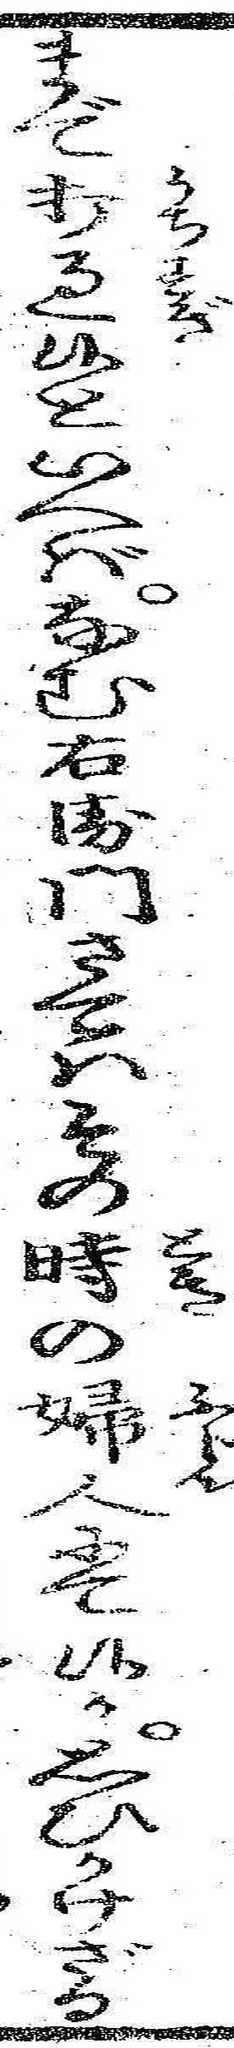まで打過候といへば。なむ右衛門さてはその時の婦人にて候か。思ひかけざる
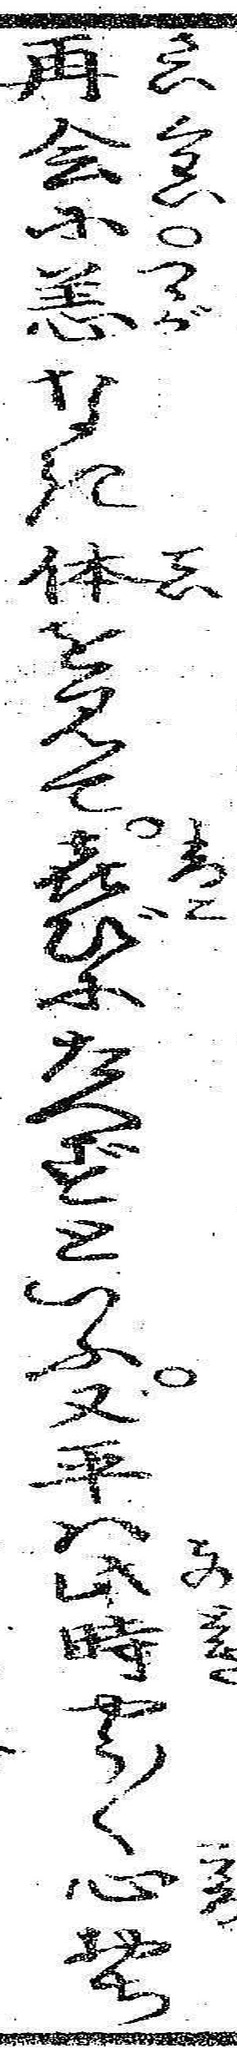再会に。恙なき体を見。て喜びにたへずといふ。又平は此時やう〳〵心おち
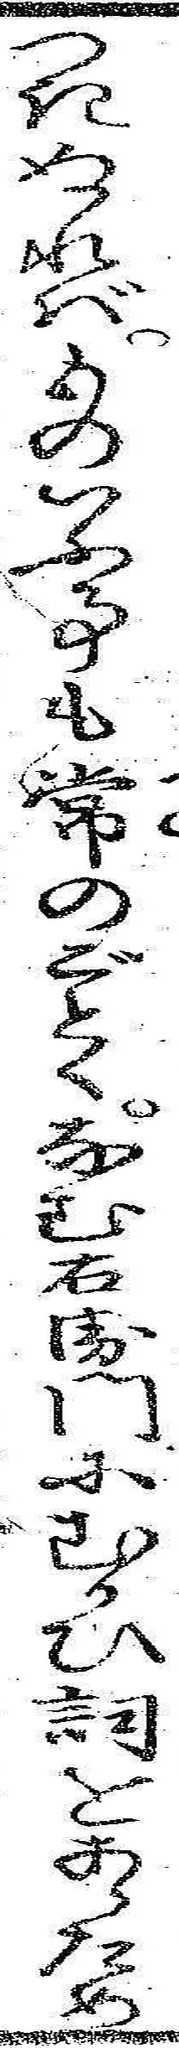つきぬれば。ものいふ事も常のごとく。なむ右衛門にむかひ。詞をあらため
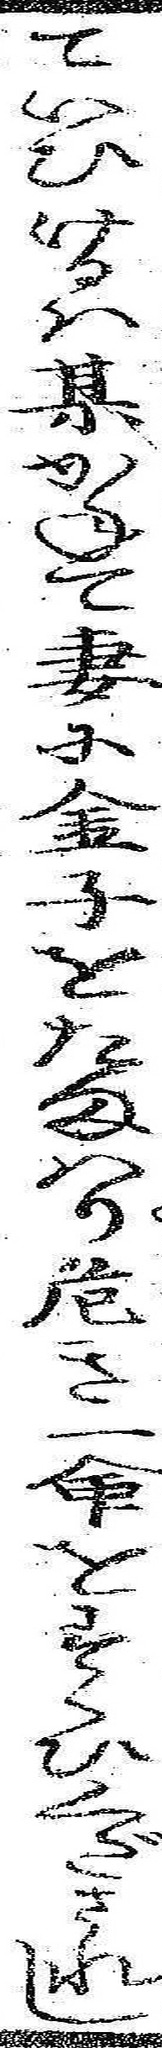ていひけるは。某かねて妻に金子をたまはり。危き一命をすくひくだされし
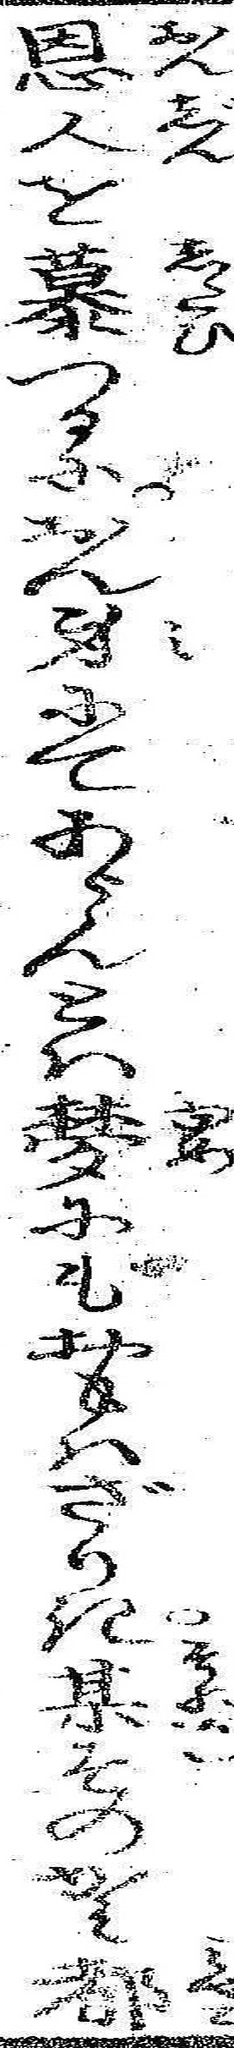恩人を慕つるに。おん身にてあらんとは夢にもおもはざりき。某そのかみ都
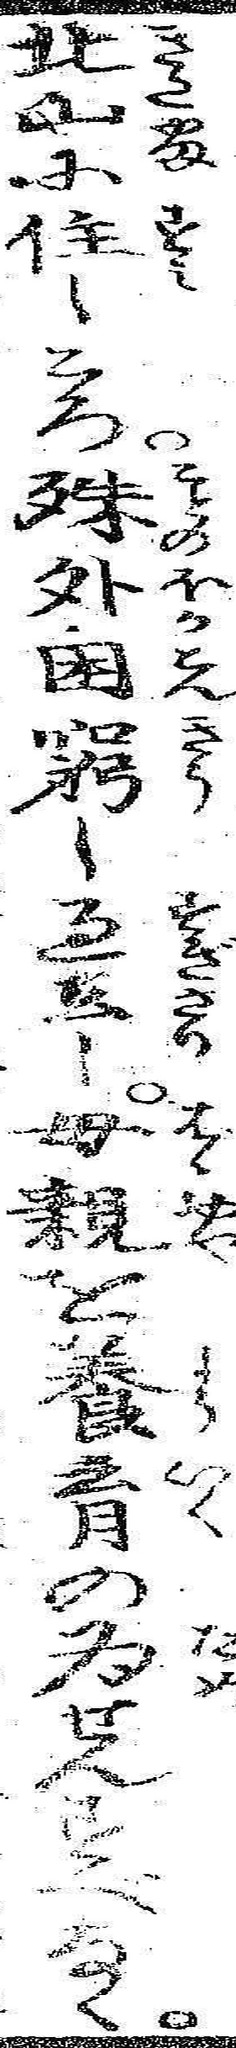北山に住しころ。殊外困窮し過去し。母親を養育の為せんすべなく。
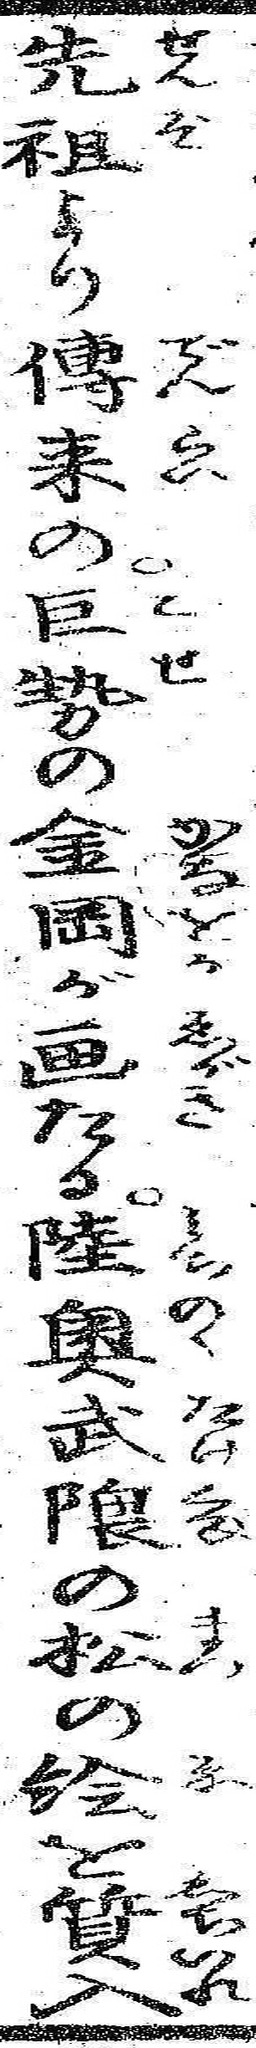先祖より伝来の。巨勢の金岡が画たる。陸奥武隈の松の絵を質入
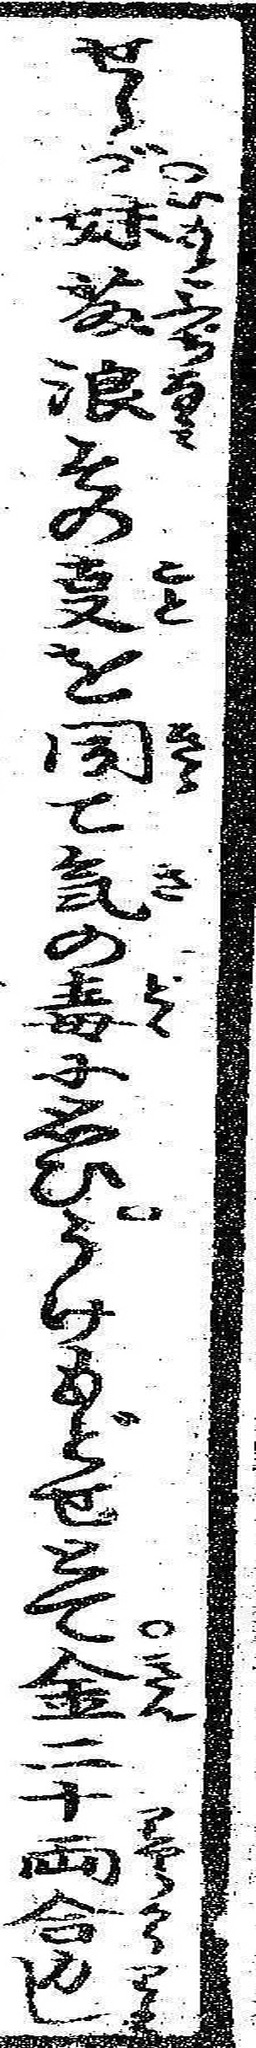せしが。妹藤浪その事を聞て気の毒に思ひ。うけもどせとて。金二十両合力し
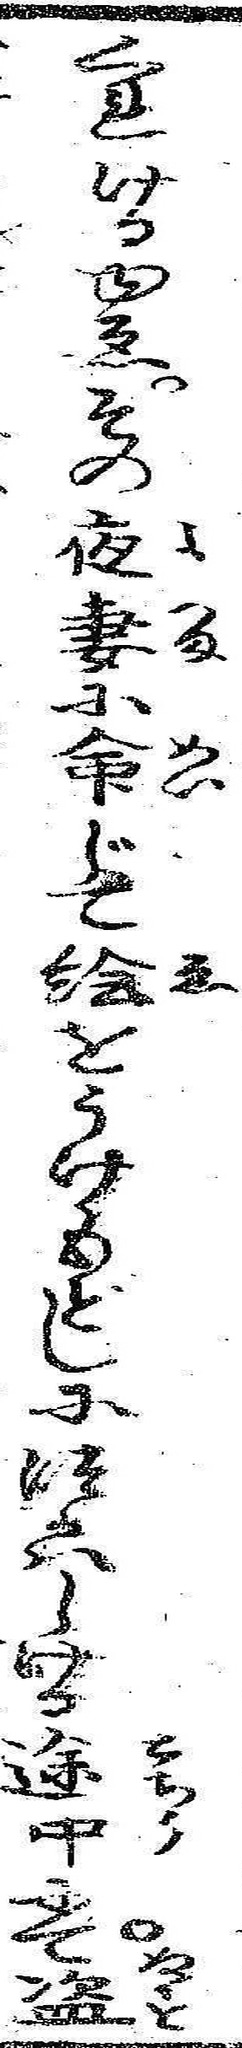くれけるゆゑ。その夜妻に命じて絵をうけもどしにつかはしける途中にて。盗
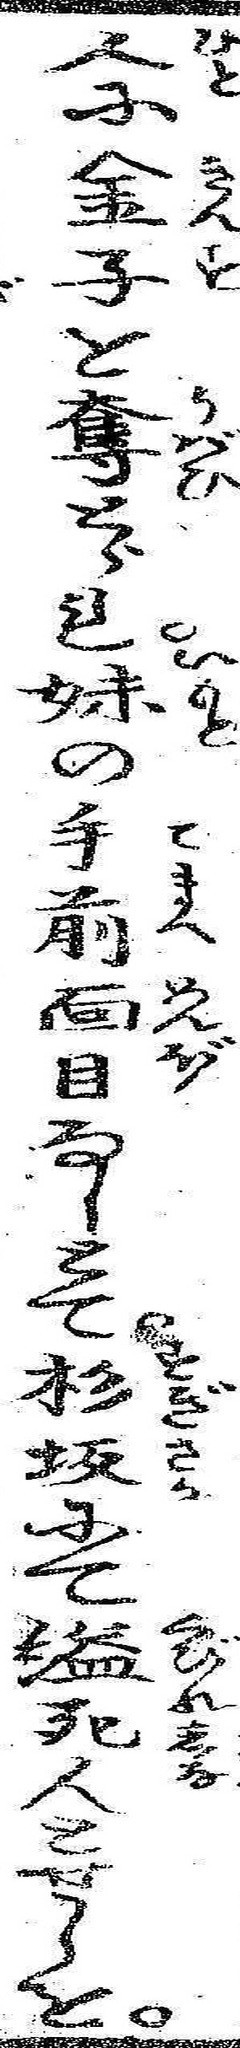人に金子を奪とられ。妹の手前面目なしとて。杉坂にて縊死んとせしを。
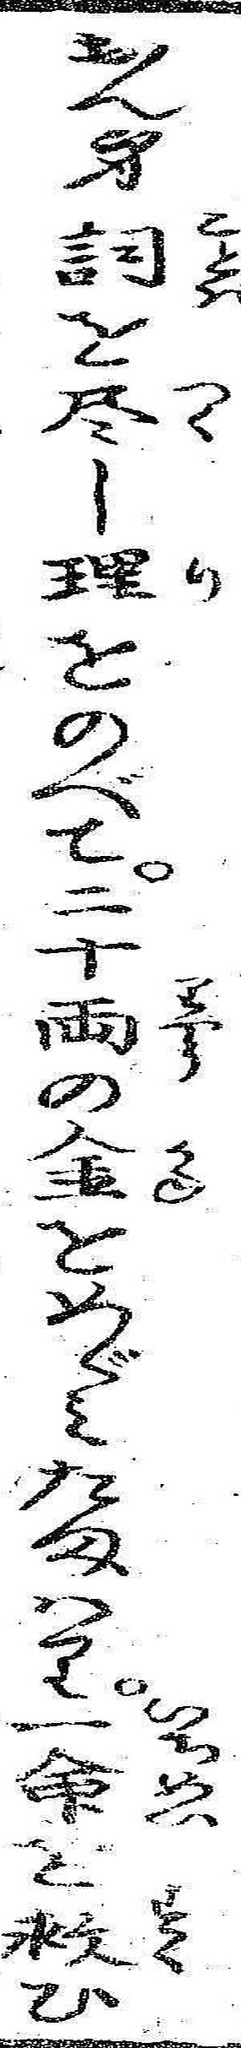おん身詞を尽し理をのべて。二十両の金をめぐみたまはり。一命を救ひ
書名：昔話稲妻表紙
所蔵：国文学研究資料館
